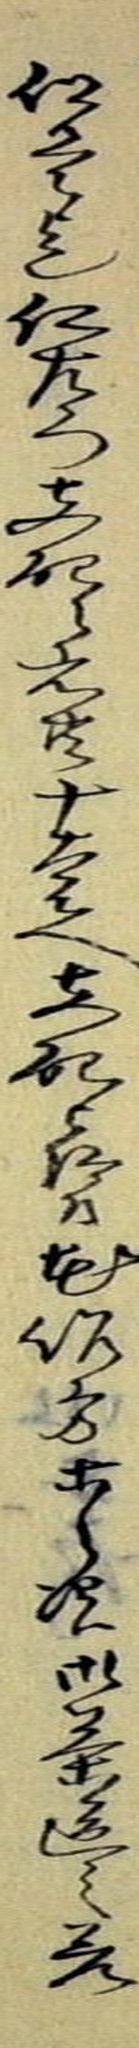但是迄仁左衛門支配之者共十太夫支配被仰付尤作方等之儀ハ御茶道之差
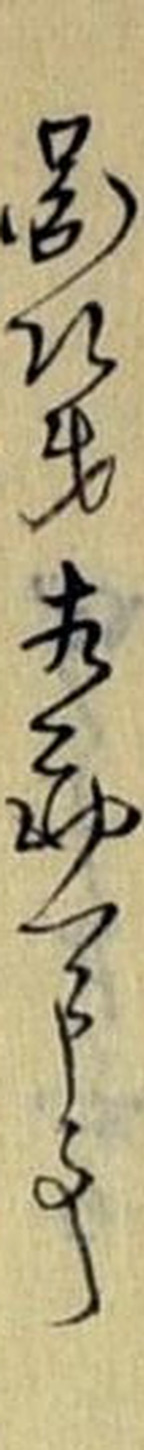図次第相勤可申事
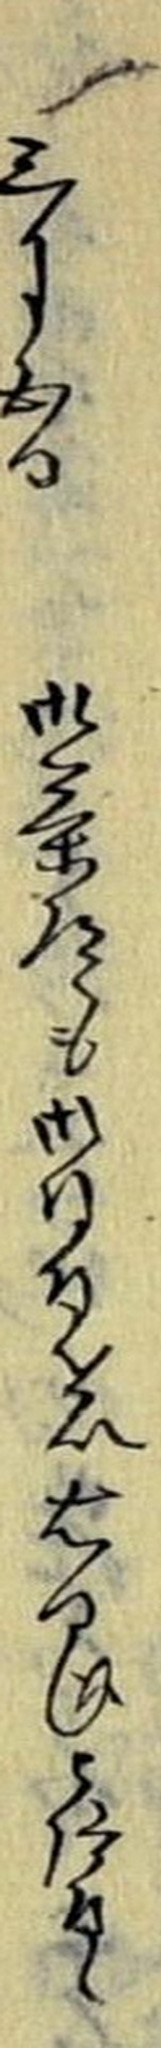三月五日御茶道へも御目付を以右同趣被付候
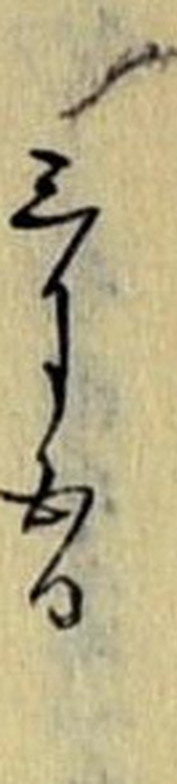三月十日
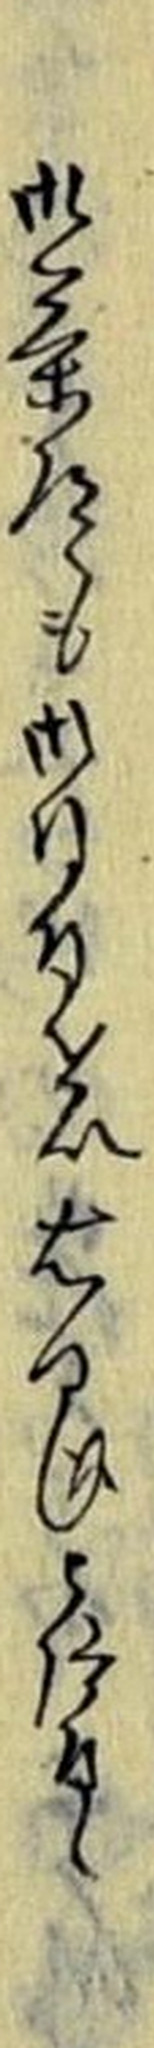三月五日御茶道へも御目付を以右同趣被付候
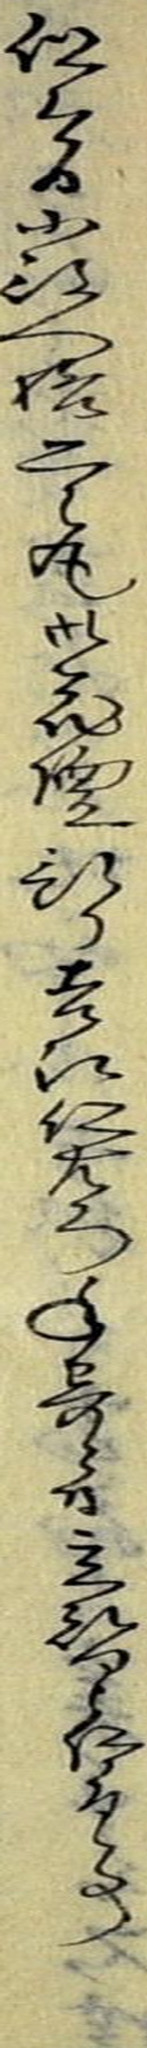但今日小役人格二ノ丸御花壇預り吉江仁左衛門年寄ニ付立替被仰付候事
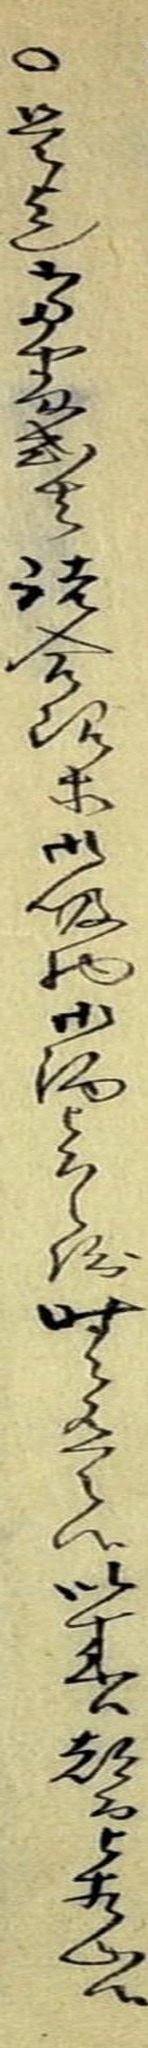〇是迄当番或者詰合限等御吸物御酒被下候儀時々有之候以来ハ都而相止候
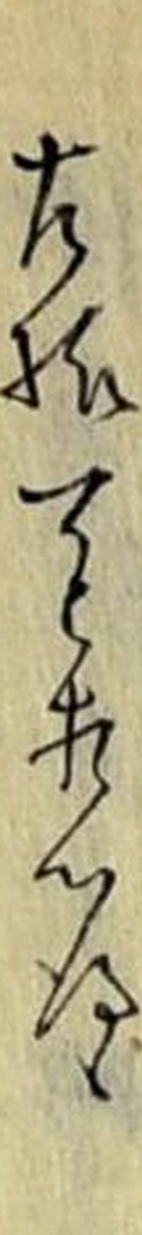左様可被相心得候
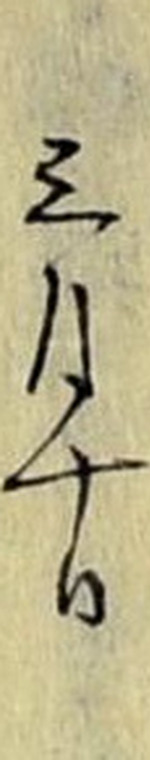三月十日
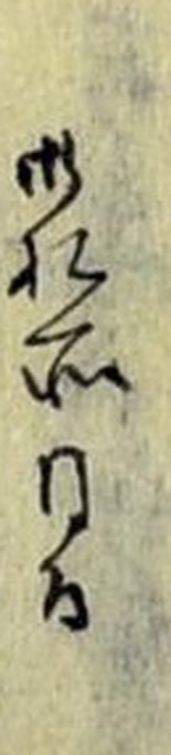御札所目付
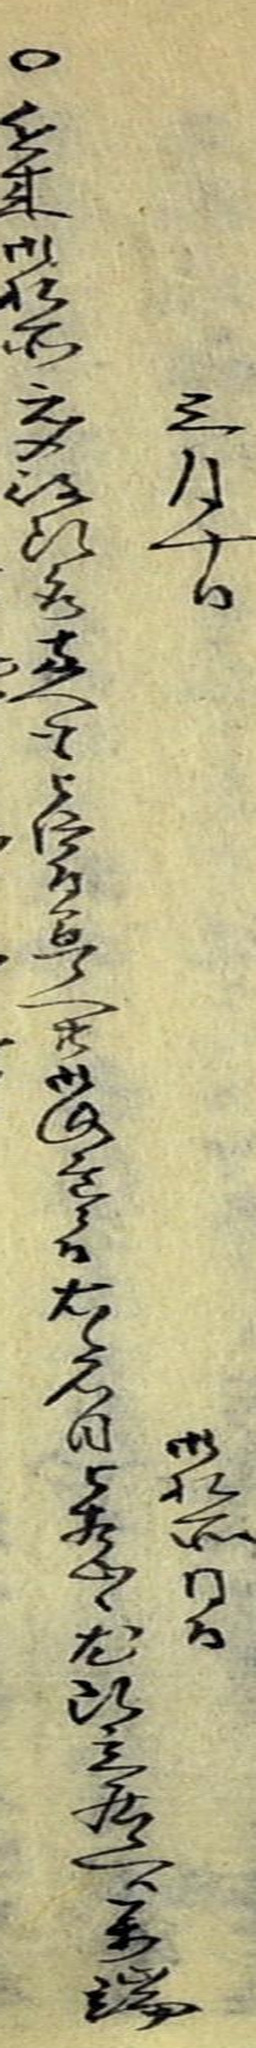〇近来御札所元〆役頭取両人ツヽ被仰付置候へ共御趣意ニ付右之名目被相止候尤頭立居候へハ万端
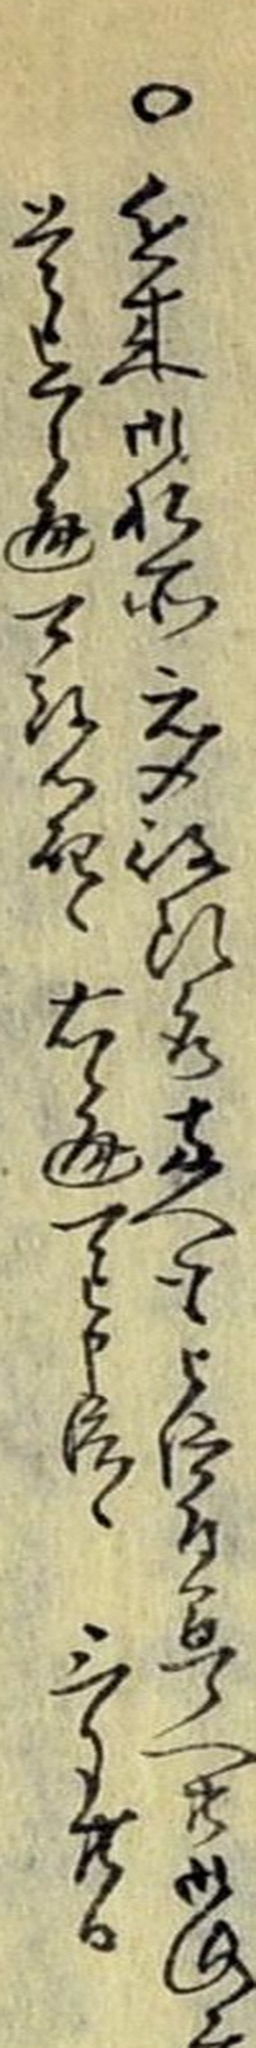是迄之通り可致心配候右之通可被申渡候三月廿日
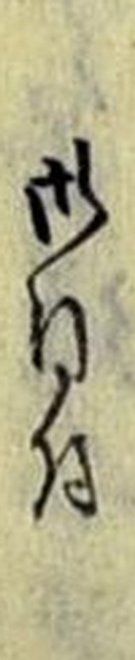御目付
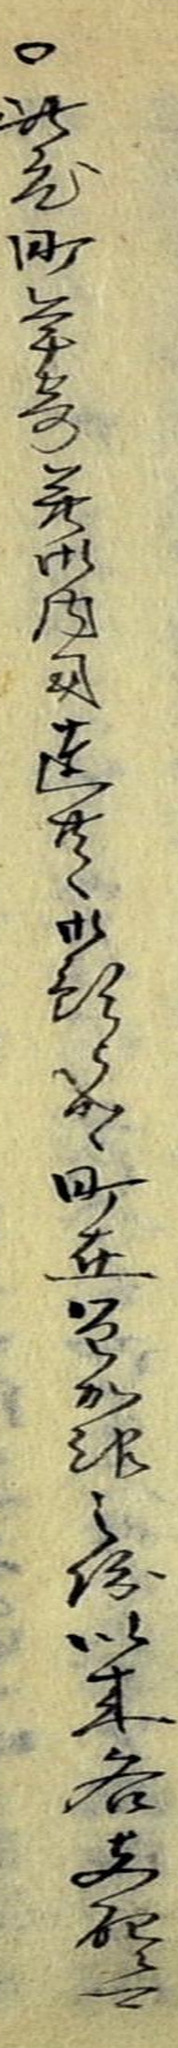〇此度町年寄并御内用達共へ御預被成候町在冥加銀之儀以来各支配ニ可
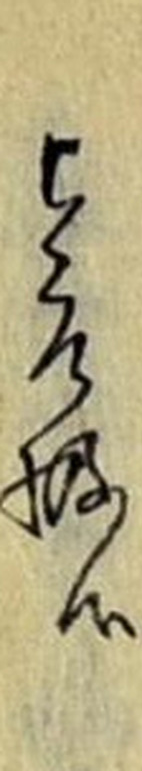被取扱候
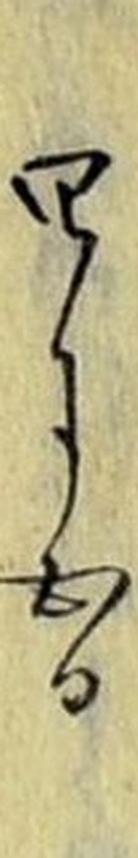四月五日
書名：命令之部 五
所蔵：福井県文書館 Fukui Prefectural Archives
